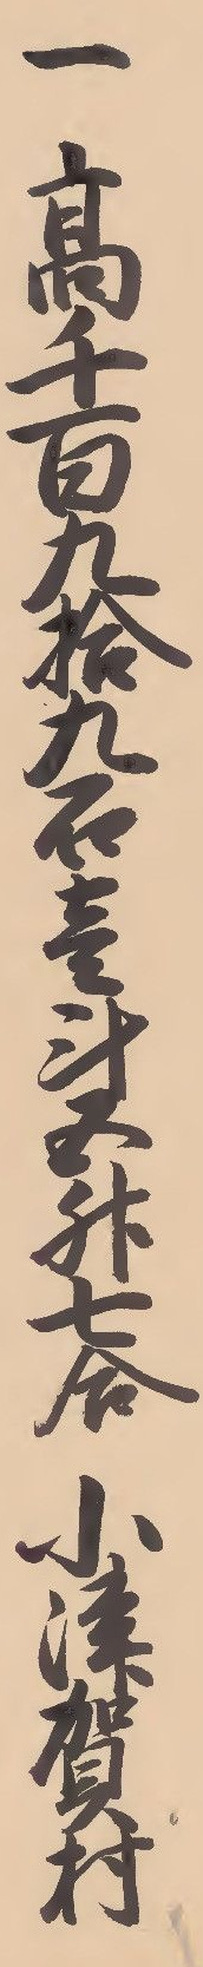一髙千百九拾九石壱斗五升七合小津賀村
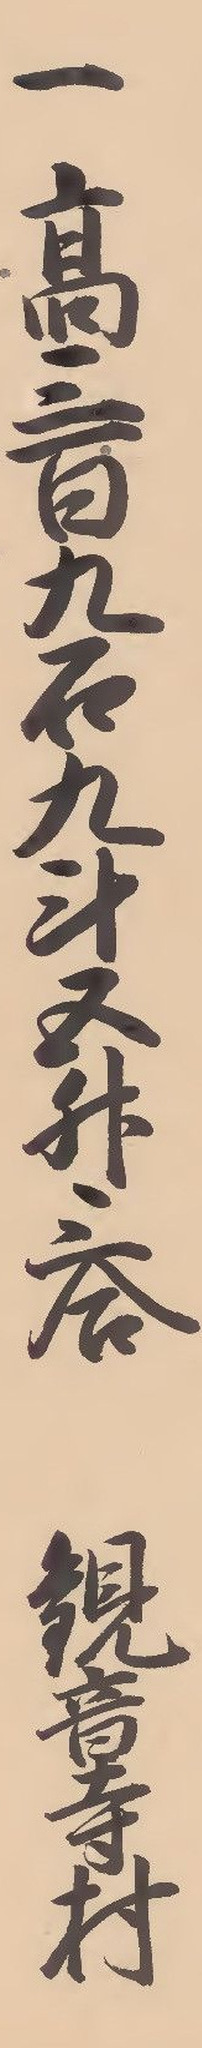一髙三百九石九斗五升三合観音寺村

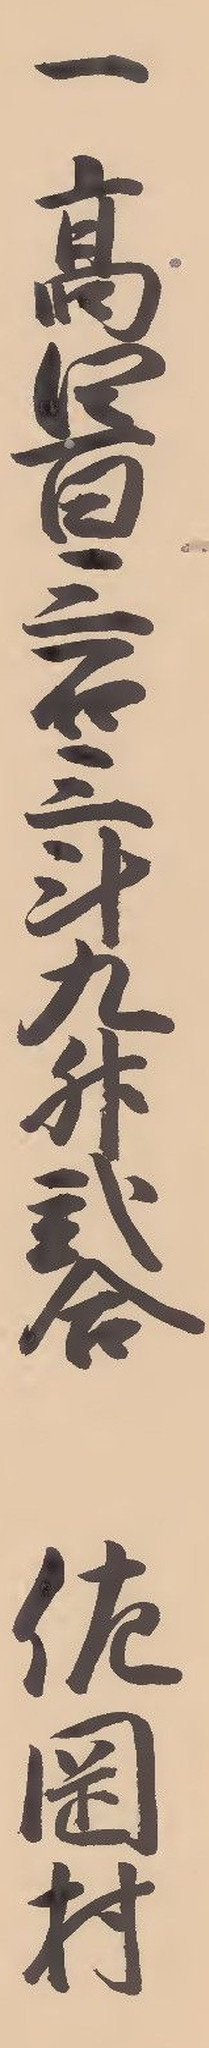一髙四百三石三斗九升弐合佐岡村
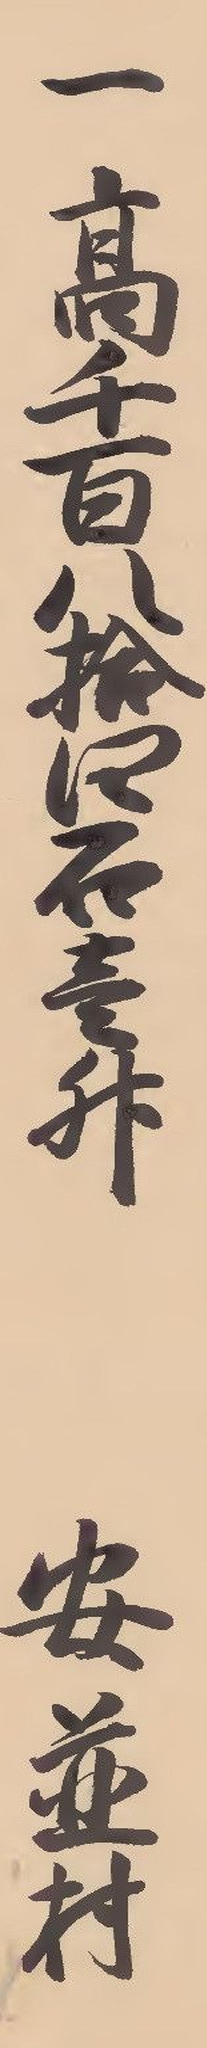一髙千百八拾四石壱斗安並村
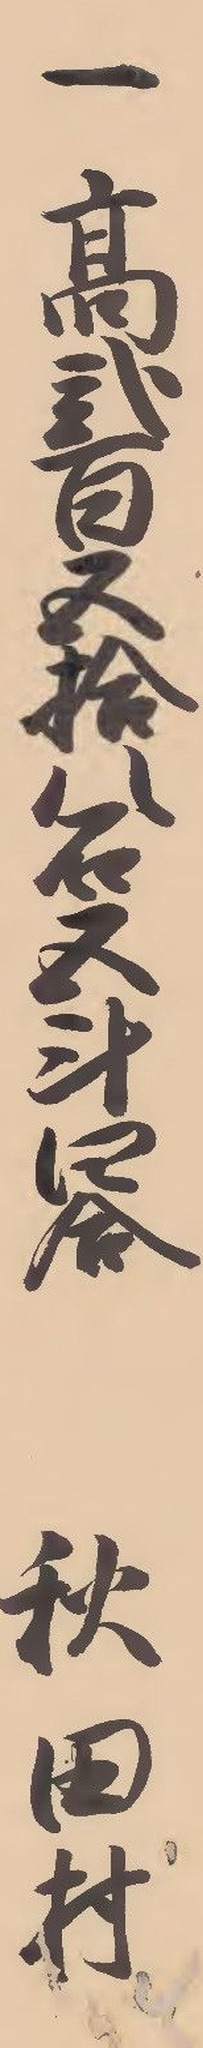一髙弐百五拾八石五斗四合秋田村
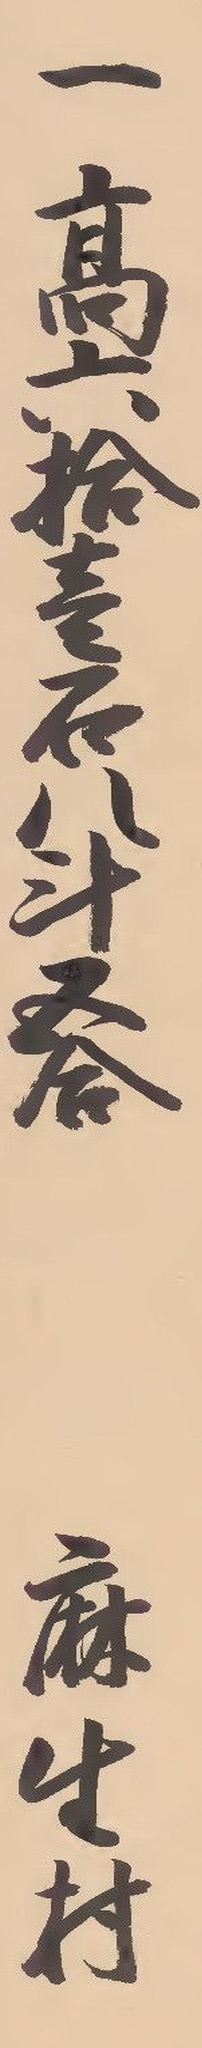一髙六拾壱石八斗五合麻生村
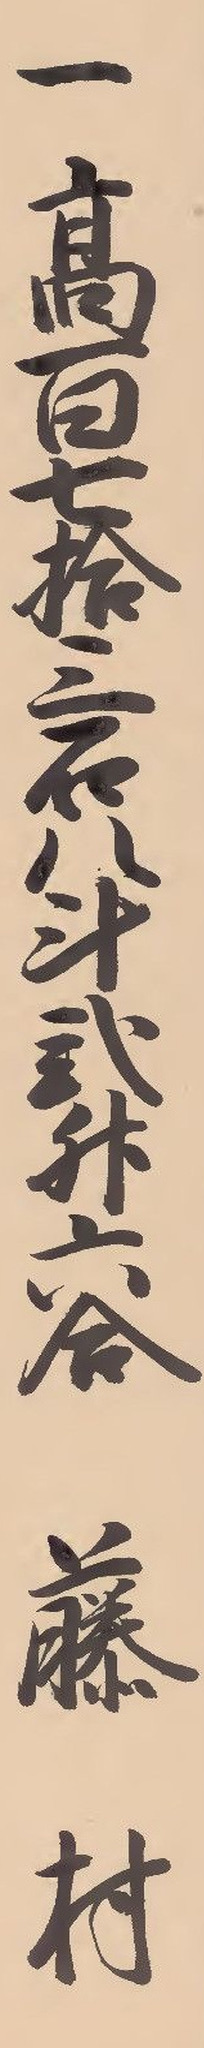一髙百七拾三石八斗弐升六合藤村
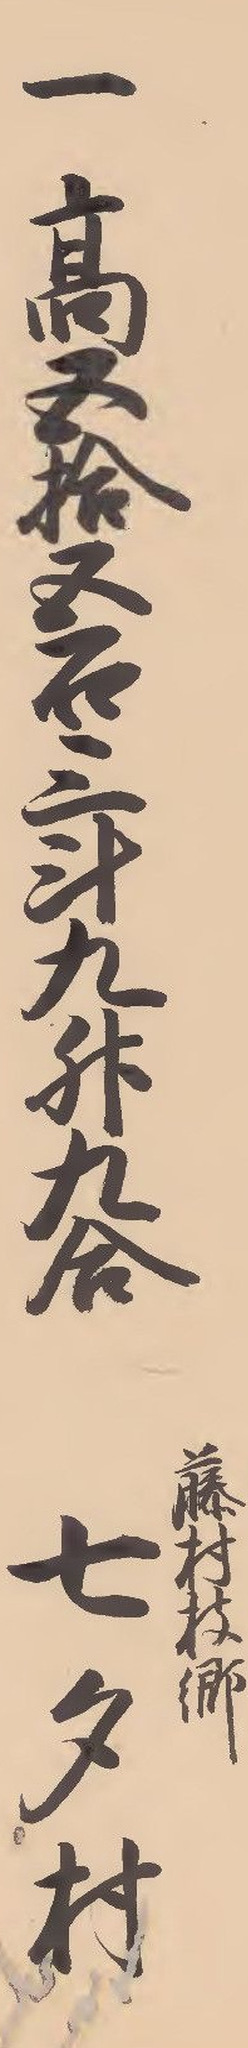一髙五拾五石三斗九升九合七夕村
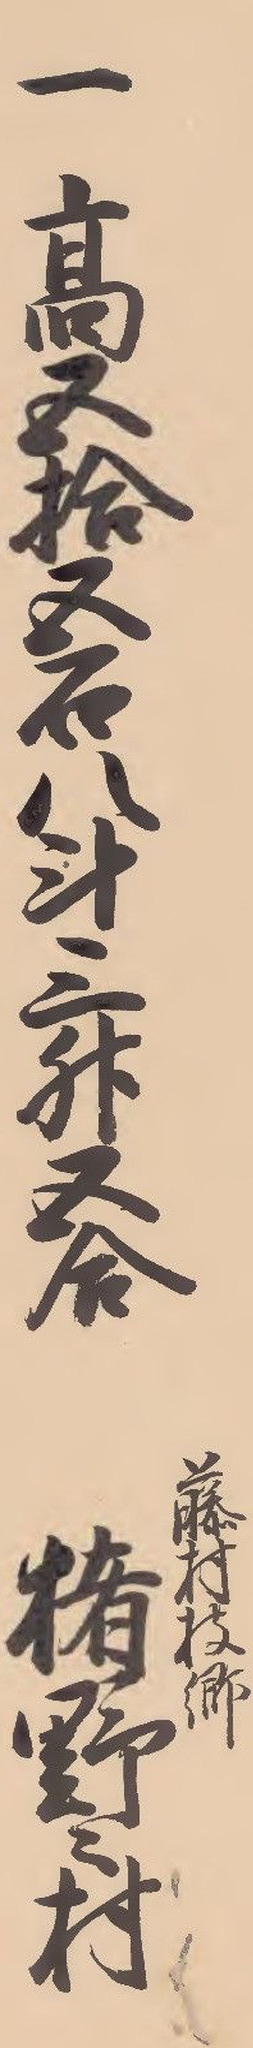一髙五拾五石八斗三升五合猪野々村
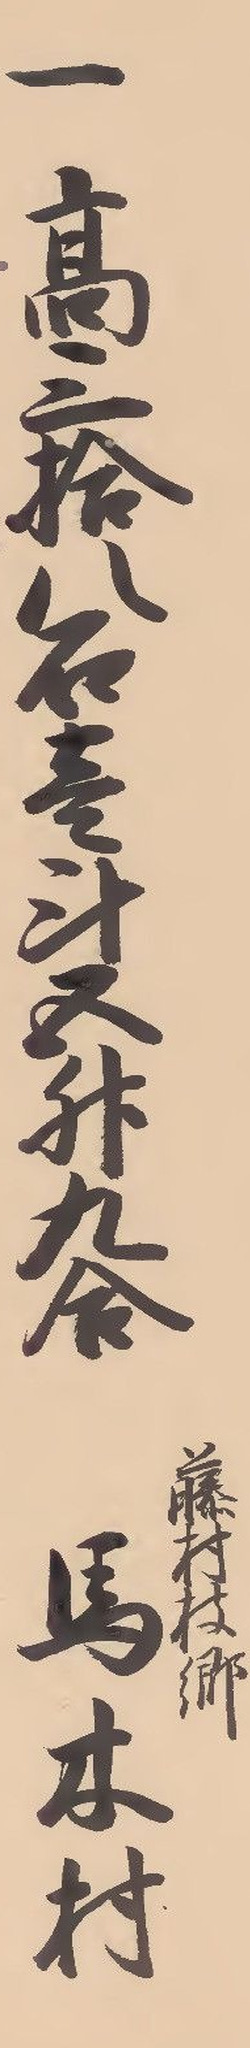一髙三拾八石壱斗五升九合馬木村

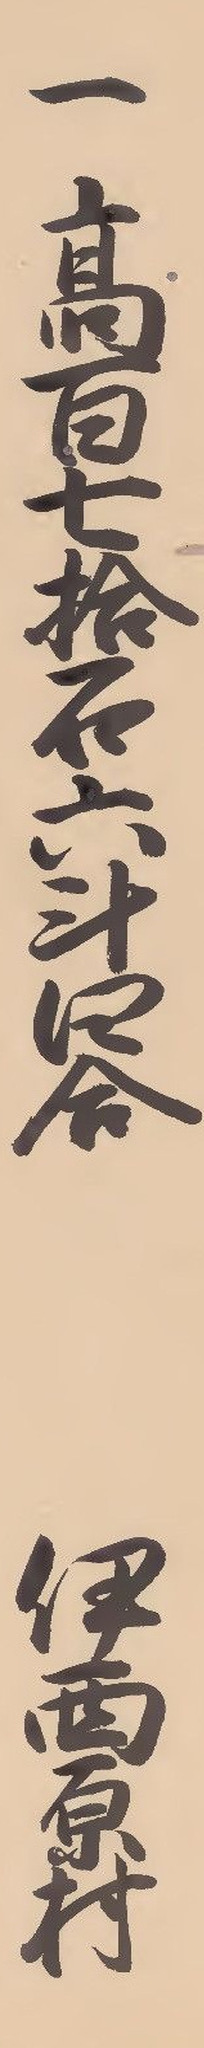一髙百七拾石六斗四合伊西原村
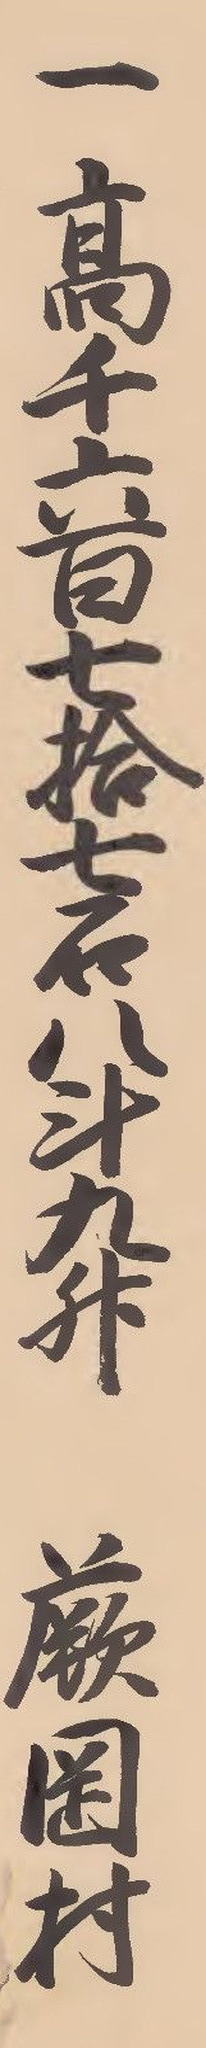一髙千六百七拾七石八斗九升蕨岡村
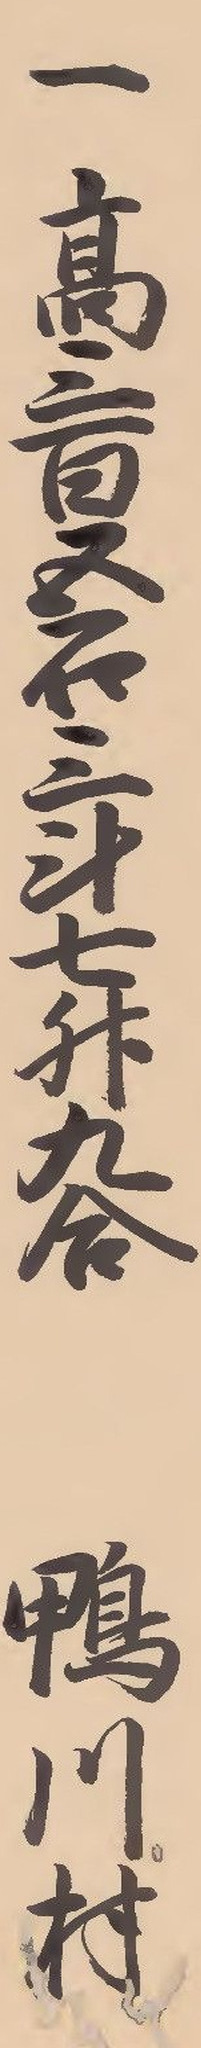一髙三百五石三斗七升九合鴨川村
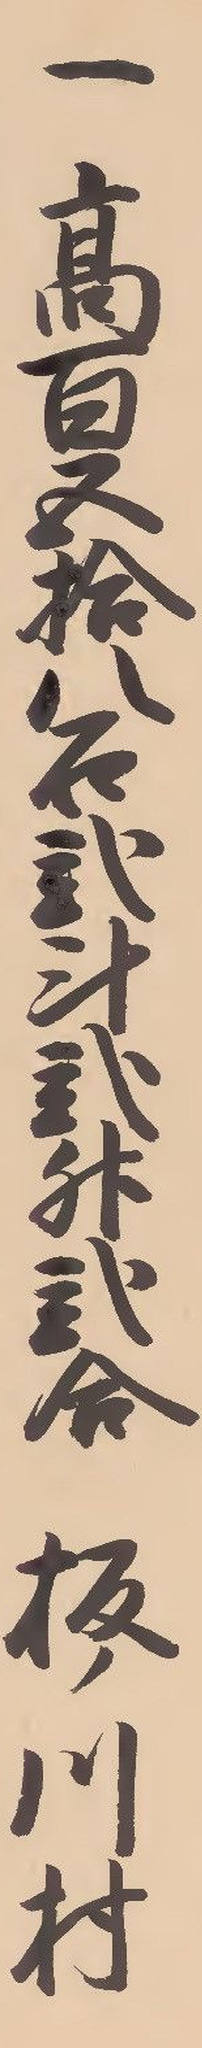一髙百五拾八石弐斗弐升弐合板ノ川村
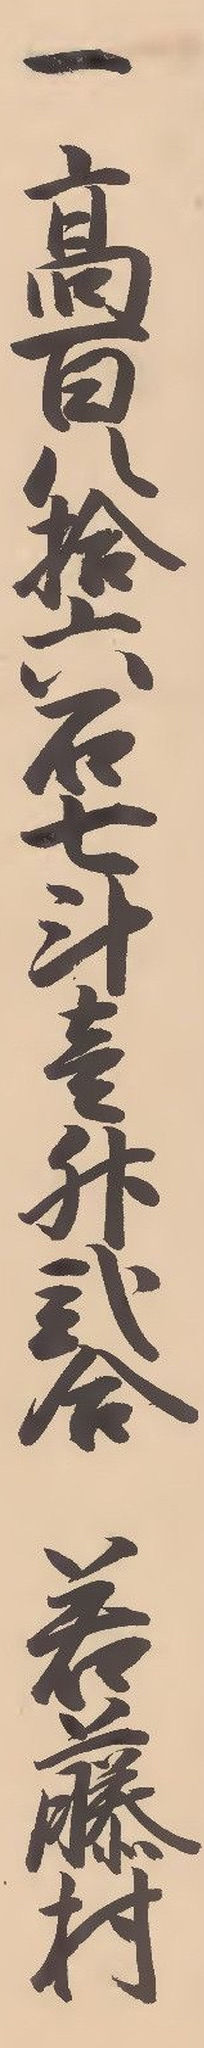一髙百八拾六石七斗壱升弐合若藤村
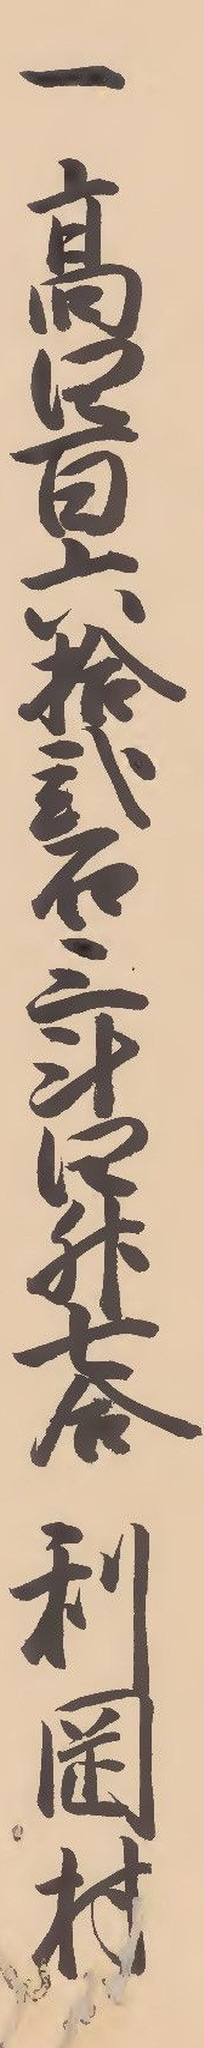一髙四百六拾弐石三斗四升七合利岡村
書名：土佐国郷帳
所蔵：国立公文書館 National Archives of Japan
